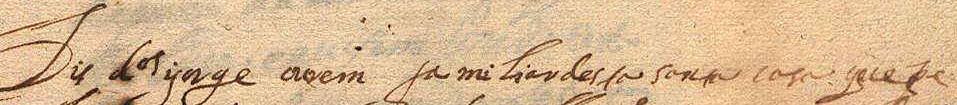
Dis dos yorge ourem familiar desta santa casa que pe
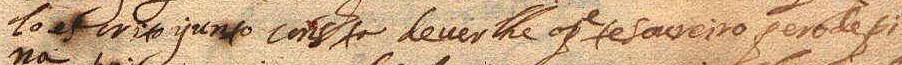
lo escrito yunto consta deuerlhe o pe tesoureiro pero de pi
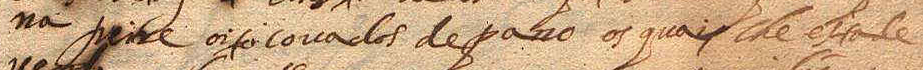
na freire oito couados de pano os quais lhe esta de
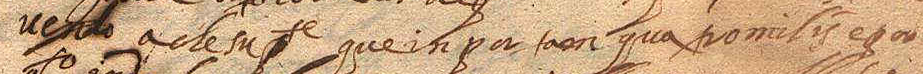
uendo a ele supte que inportam quatro mil rs̄ e por
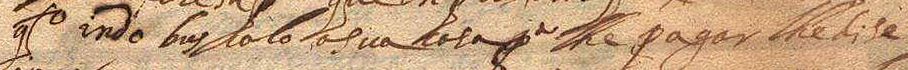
qto indo buscalo a sua casa pa lhe pagar lhe dise
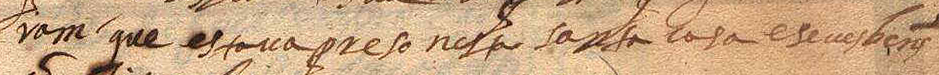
ram que estaua preso nesta santa casa e seues bens
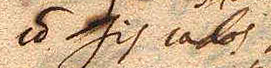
cōfiscados
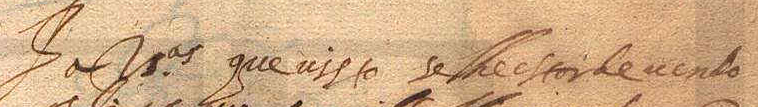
P a V s.as que uisto se lhe estar deuendo
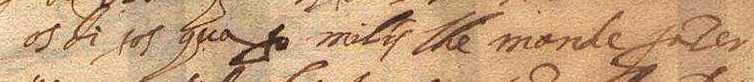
os ditos quato mil rs̄ lhe mande fazer
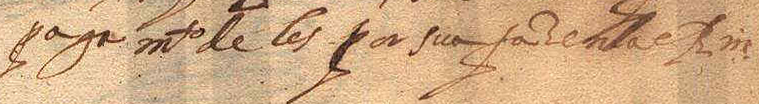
pagamto deles por sua fazenda e R m̄
